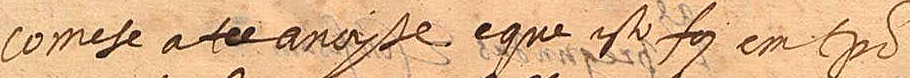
comese atee a noyte e que isto foj em tpō
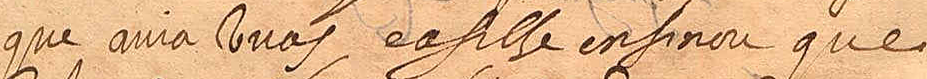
que avia uvas, e asi lhe ensinou que
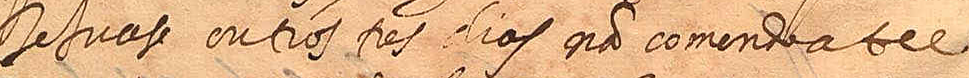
Jejuase outros tres dias nā comendo atee
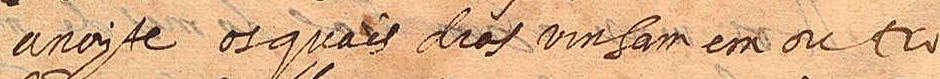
a noyte os quais dias vinham em outro
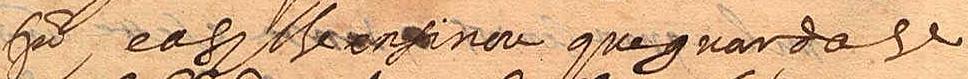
tpō, e asj lhe ensinou que guardase
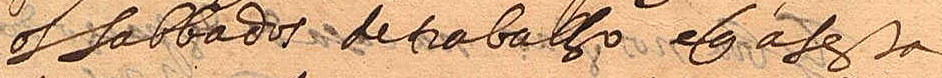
os sabbados de trabalho e q̄ a sesta
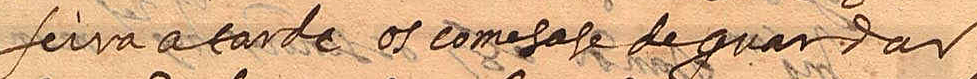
feira a tarde os comesase de guardar
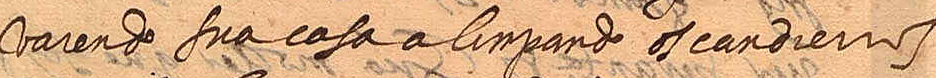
varendo sua casa alimpando os candieiros
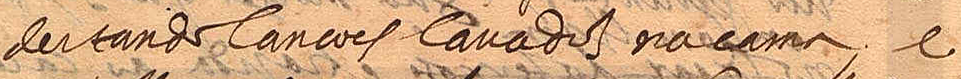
deitando lancoes lavados na cama, e
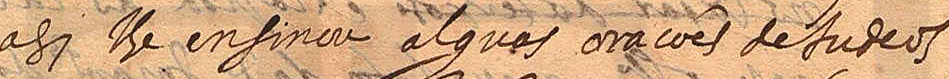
asj lhe ensinou alguas oracões de Judeos
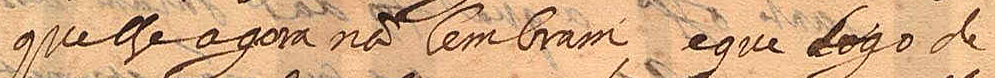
que lhe agora não lembram, e que logo de
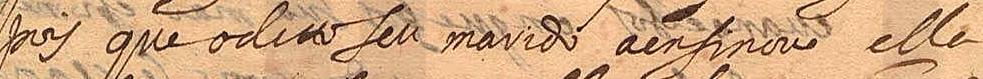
pois que o ditto seu marido a ensinou ella
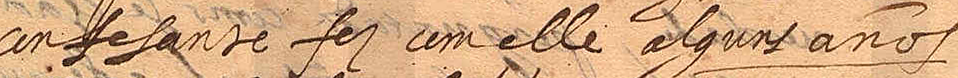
confesante fez com elle alguns an̄os
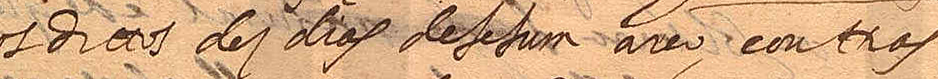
os dittos des dias de jejum areo, e outras
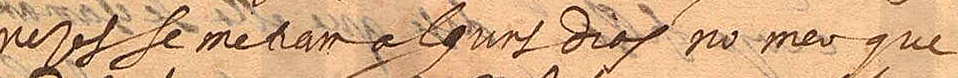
vezes se metiam alguns dias no meo que
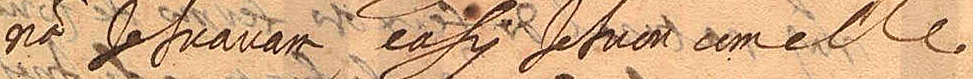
nā jejuavam, e asy jejuou com elle
